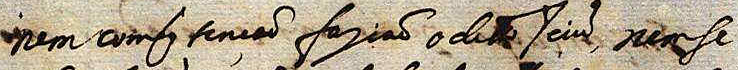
nem com q̄ tençaõ faziaõ o ditto Jeiū, nem se
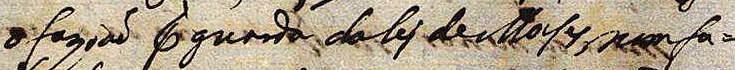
o faziaõ ꝓ guarda da lej de Moises, nem fa
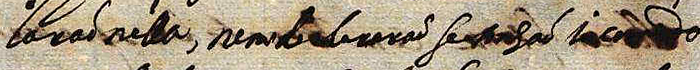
laraõ nella, nem declararaõ se tinhaõ i_ co__do
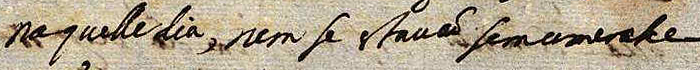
naquelle dia, nem se estauaõ sem comer ate
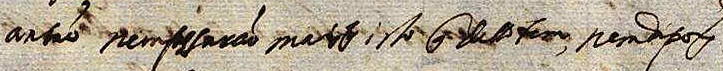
antaõ nem passaraõ mais q̄ isto q̄ ditto tem, nem depois
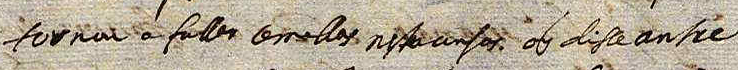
tornou a fallar com ellas nesta cousas. o q̄ disse antre
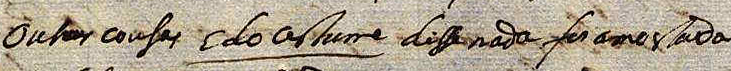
outras cousas E do costume disse nada foi amoestada
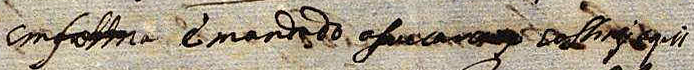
Em forma & mandado a seu carc___ E assinej aqui
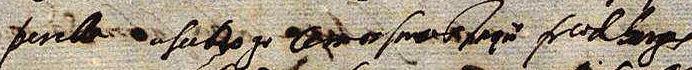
por ella a seu Rogo com os snores Inqur frco de burges
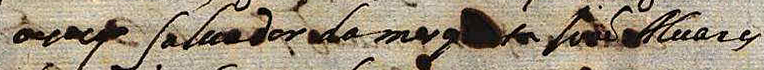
o escreuj saluador da mesq__ta Joaõ Aluares
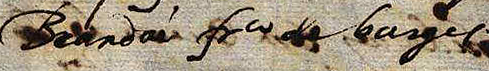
Brandaõ frco de burges
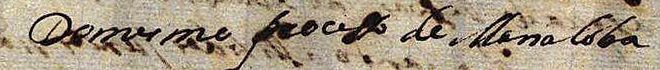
Do mesmo processo de Maria loba
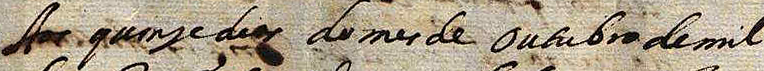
Aos quinze dias do mes de Outubro de mil
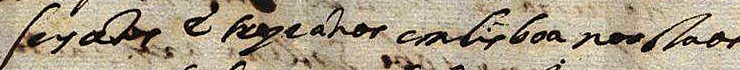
Seiscētos & treze an̄os em lisboa nos estaos
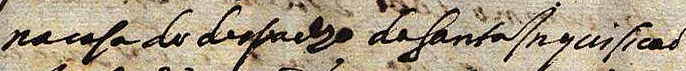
na casa do despacho da santa Jnquisicaõ
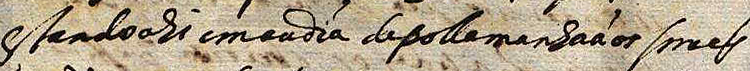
estando ahi em audiā de polla manhaã os Snres̄
